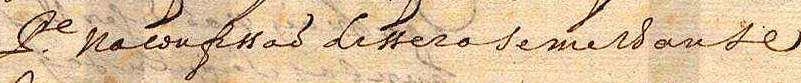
P.e na confissaõ dissera semelhante
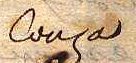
Couza
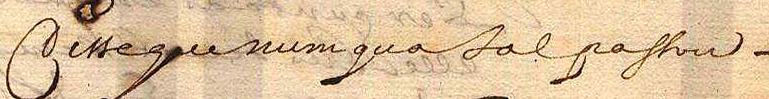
Disse que numqua tal passou
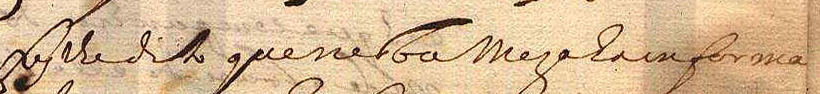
foj lhe dito que nesta Meza ha informa
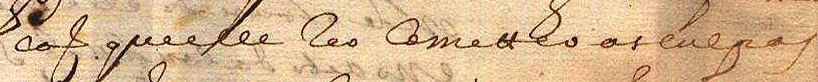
çaõ que elle Reo cometteo as culpas
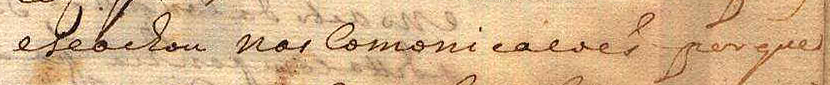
e se achou nas comonicaçoẽs per que
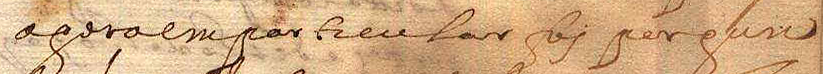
agora em particular foj pergun
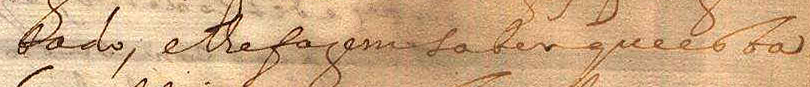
tado, e lhe fazem saber que esta
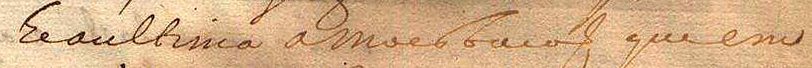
he a ultima amoestaçaõ que em
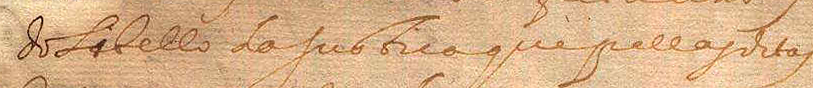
do Libello da Justiça que pellas ditas
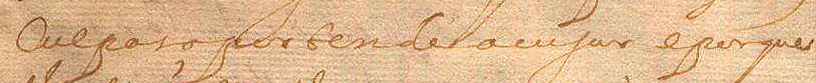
culpas o pertende acusar e porque
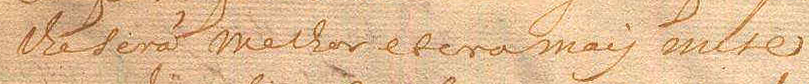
lhe será melhor e tera mais mise
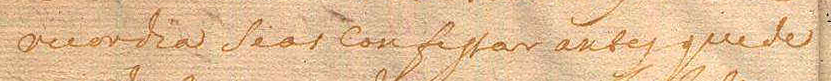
ricordia se as confessar antes que de
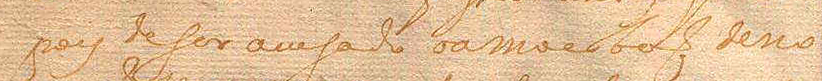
pois de ser acusado o amoestaõ de no
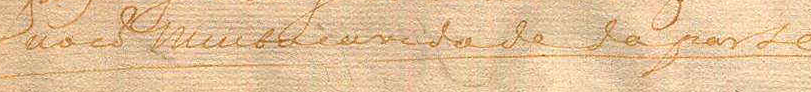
uo cō muita caridade da parte
